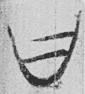曰
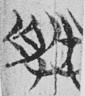朕
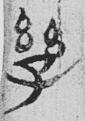孳
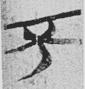不
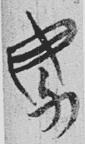○（敏）
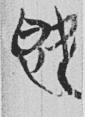既
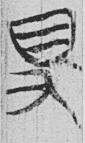○（得）
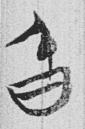昏（聞）
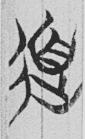道
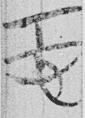○（恐）
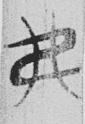弗
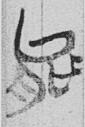能
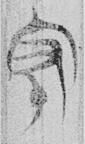守
